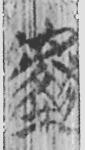獻
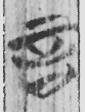言
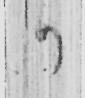人
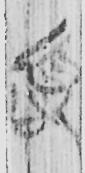頌
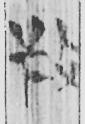攼
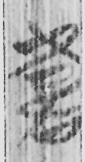{韋口}
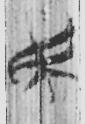民
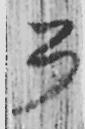乃
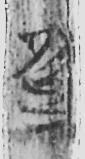{卲止}
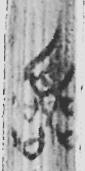囂
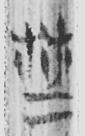{𣏟止}
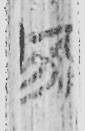所
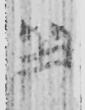并
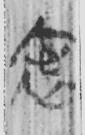{衣心}
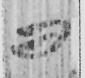日
